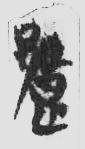郎
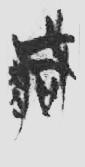戕
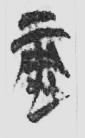坪
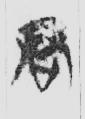君
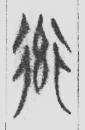率
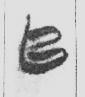𠂤
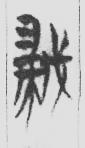{帚戈}
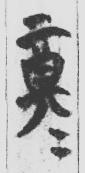奠=
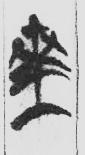皇
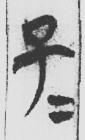子=
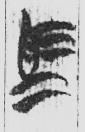馬
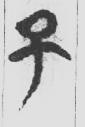子
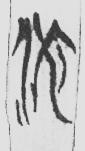池
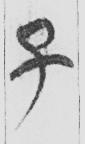子
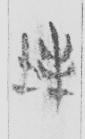{土丰}
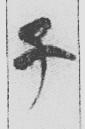子
